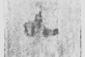十
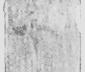七
